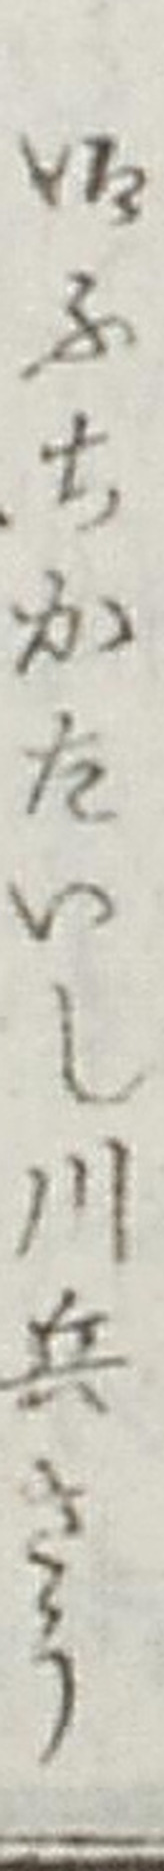御ふちかたいし川兵さう
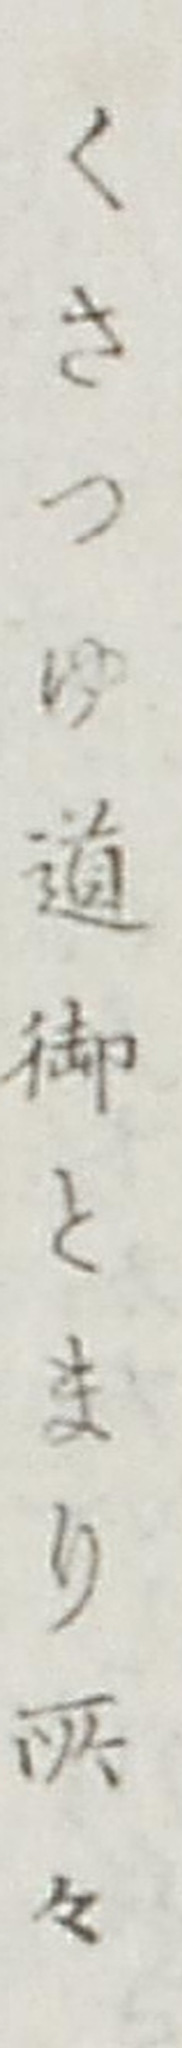くさつゆ道御とまり所々
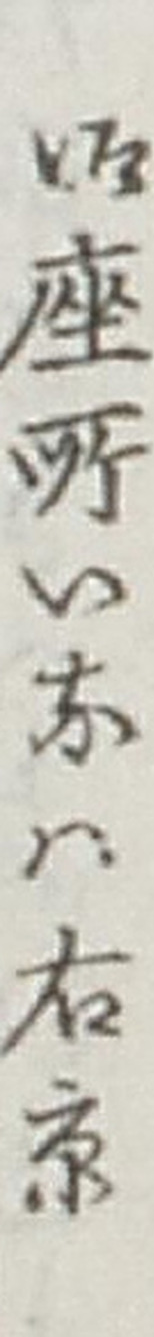御座所いなは右京
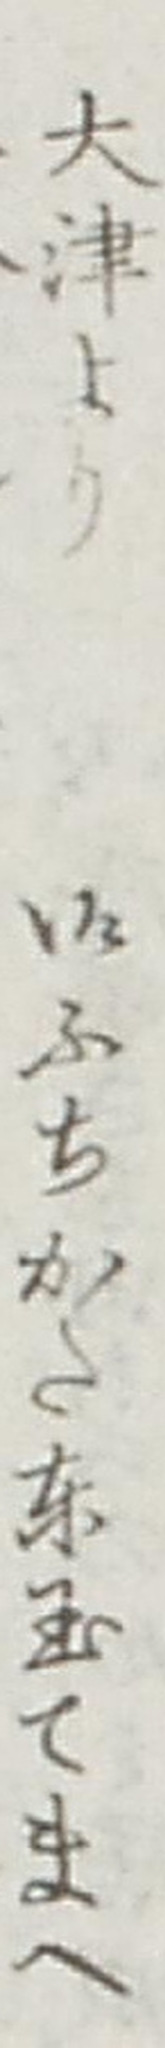大津より御ふちかた東至てまへ
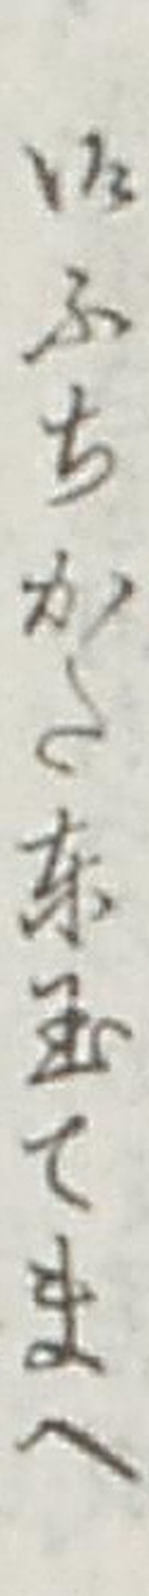御ふちかたなかとてまへ
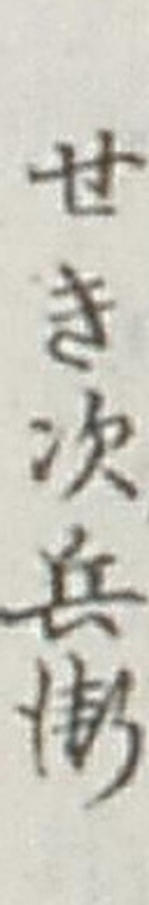せき次兵衛
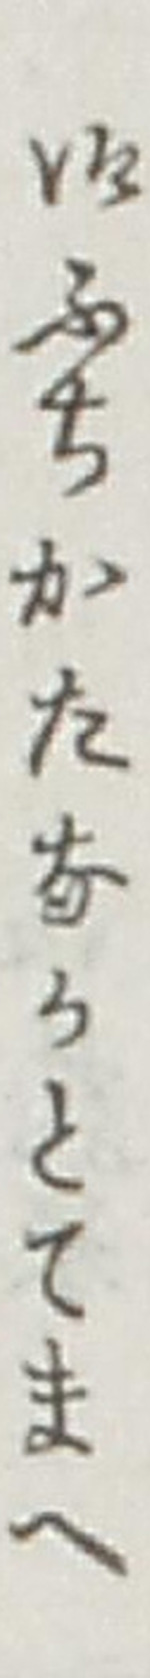御ふちかたなかとてまへ
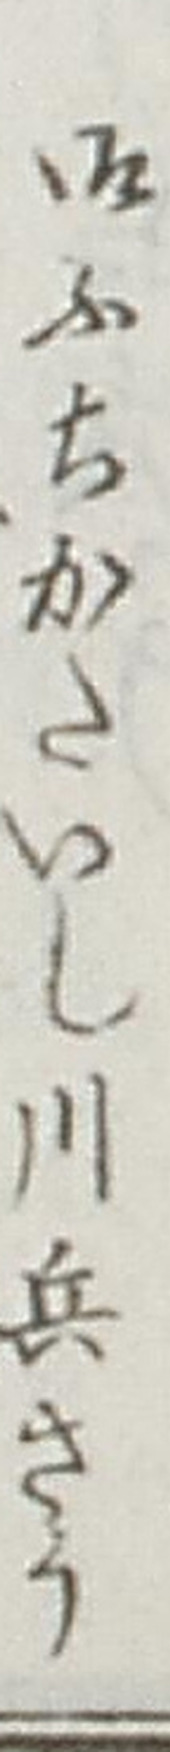御ふちかたいし川兵さう
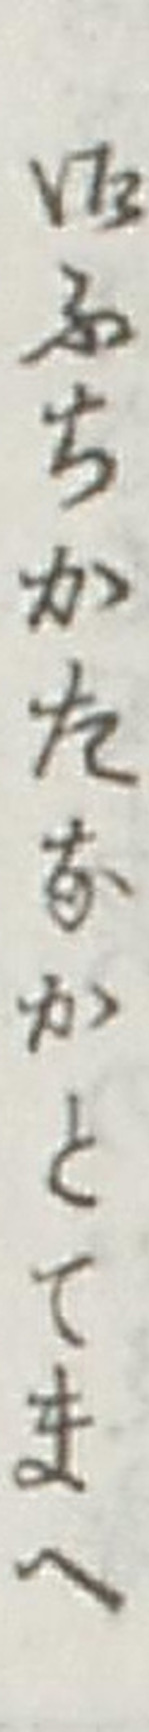御ふちかたなかとてまへ
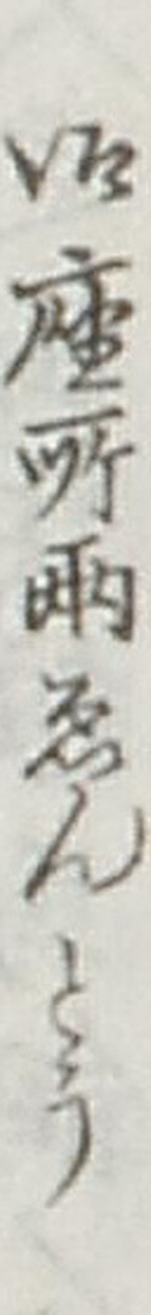御座所両ゑんとう
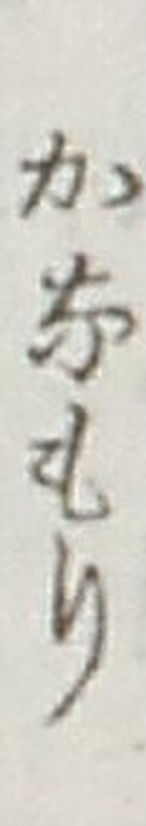かなもり
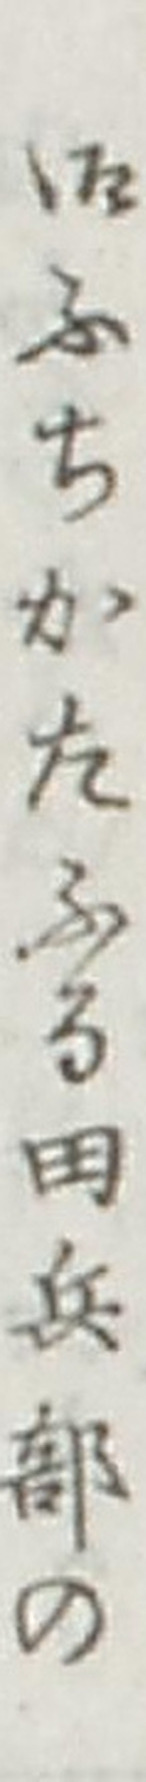御ふちかたふる田兵部の
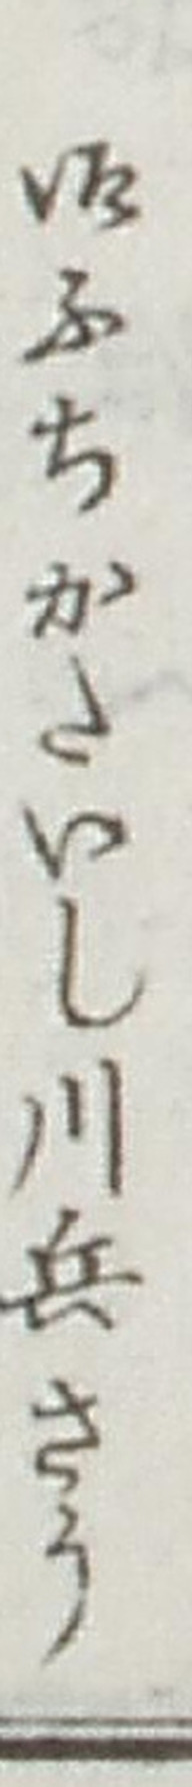御ふちかたいし川兵さう
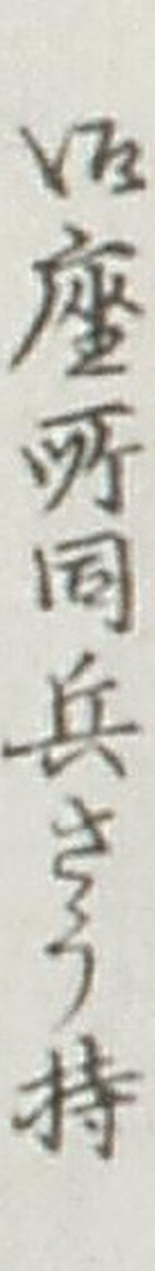御座所同兵さう持
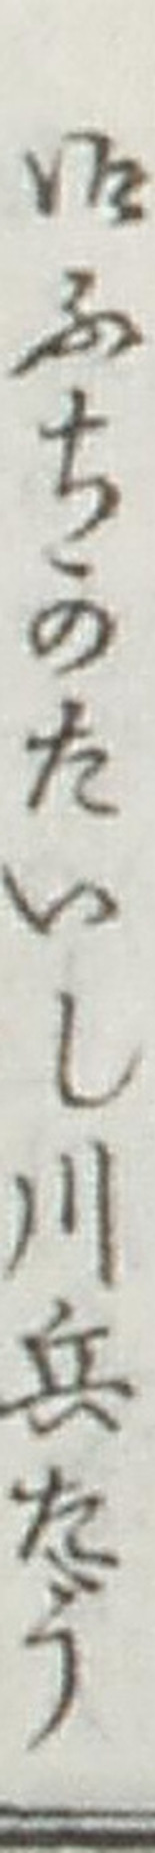御ふちかのたいし川兵たう

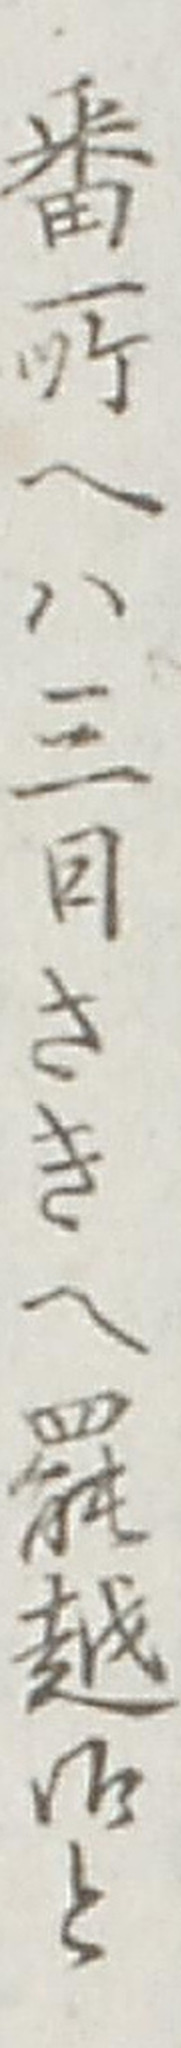番所へは三日さきへ罷越御と
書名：草津温泉誌　全
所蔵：東京大学地震研究所図書室 Earthquake Research Institute Library, The University of Tokyo, JAPAN
